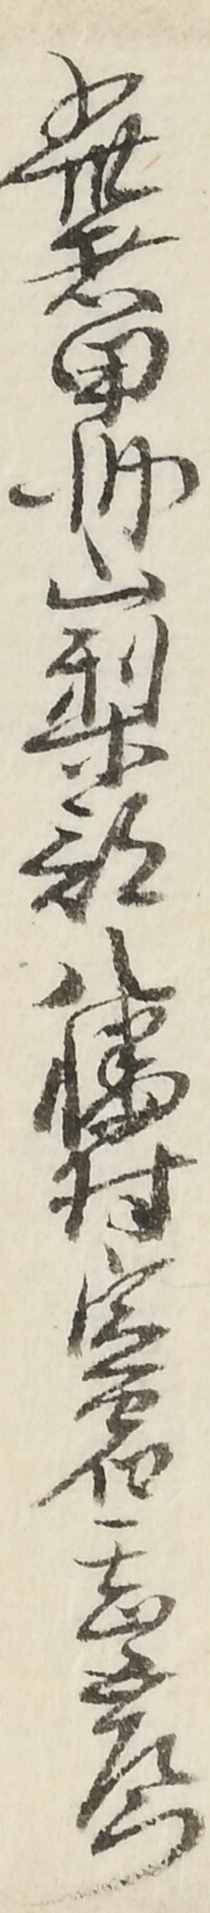此者甲州山梨郡八幡村定宿甚五右衛門
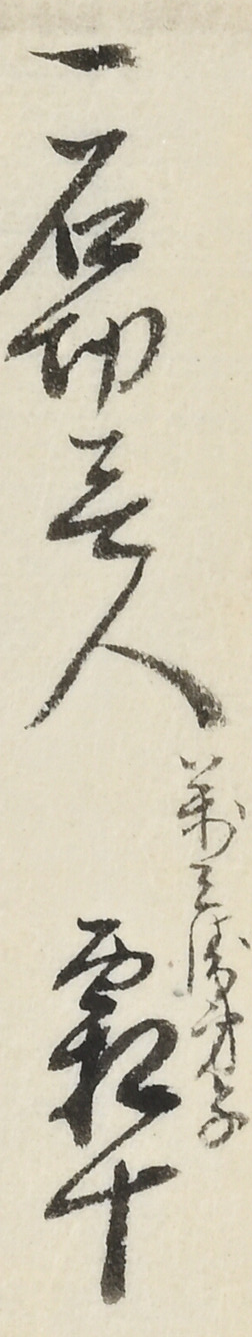一石切壱人鶴松
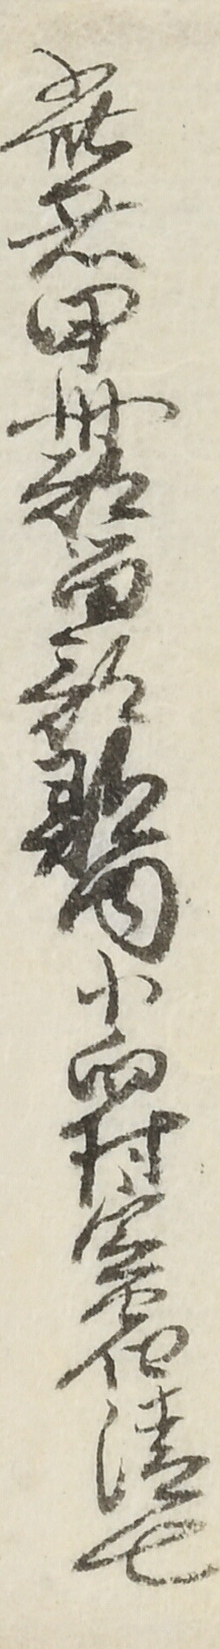此者甲州都留郡郡内小向村定宿清七

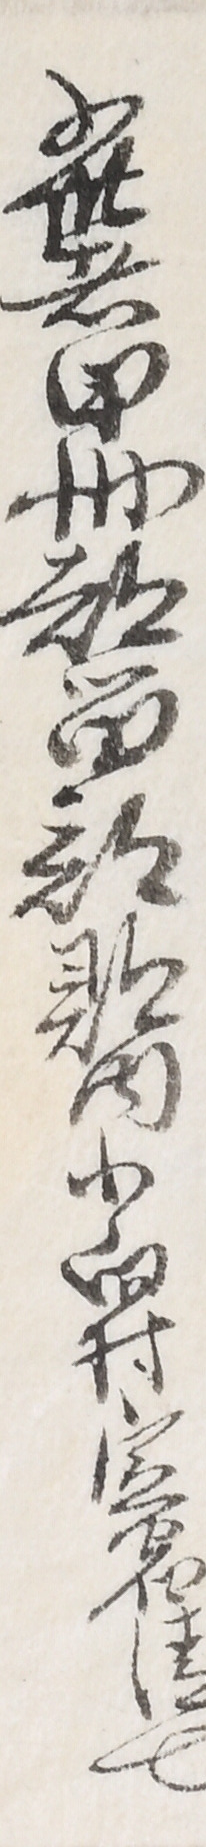此者甲州都留郡郡内小向村定宿清七
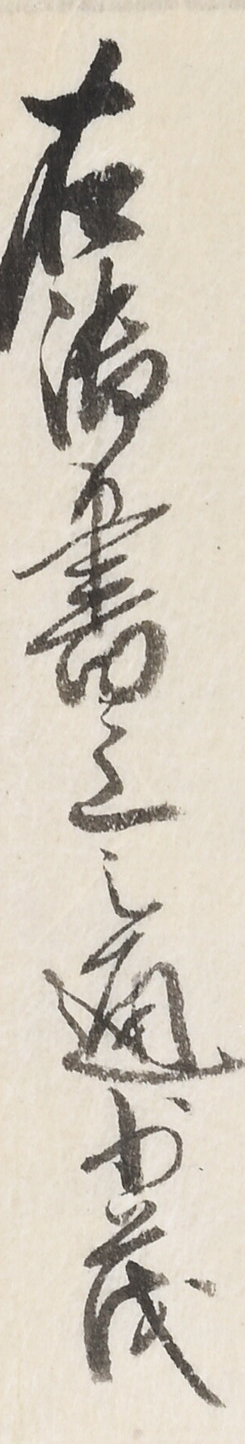右御書上之通少も
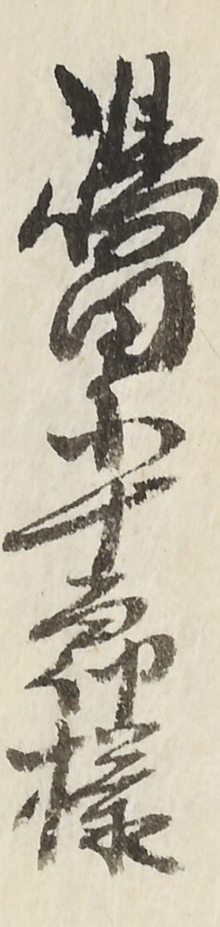島田小十郎様
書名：嘉永六癸丑年二月他國出石切名前書上帳
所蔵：伊那市立高遠町図書館・合同会社AMANE
